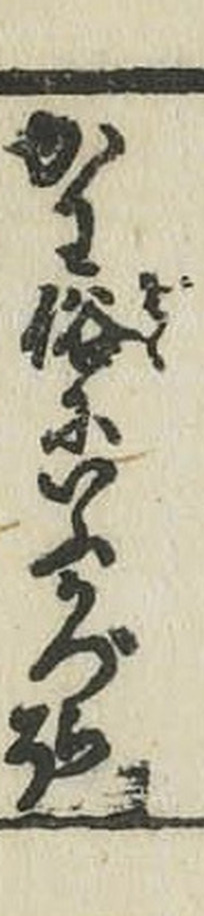かわ俗にいふかづらう
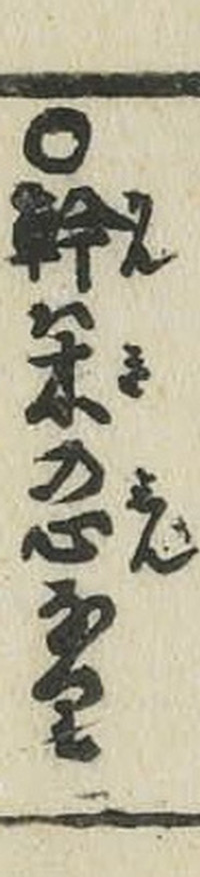○幹は木の心なり
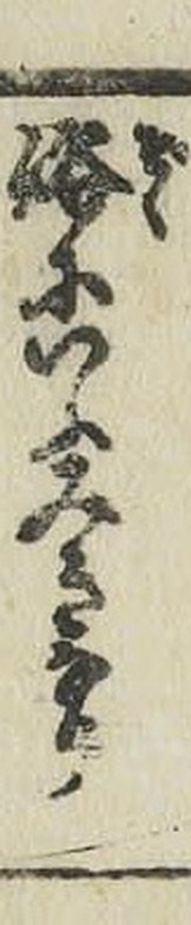俗にいふみきなり
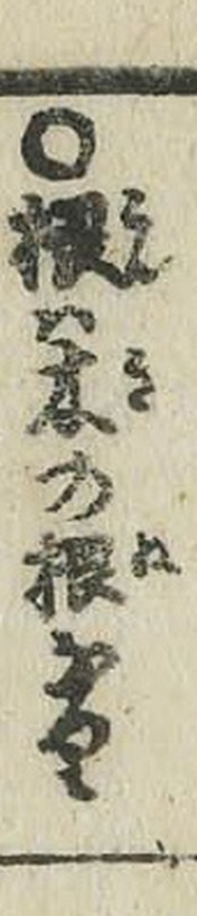○根は木の根なり
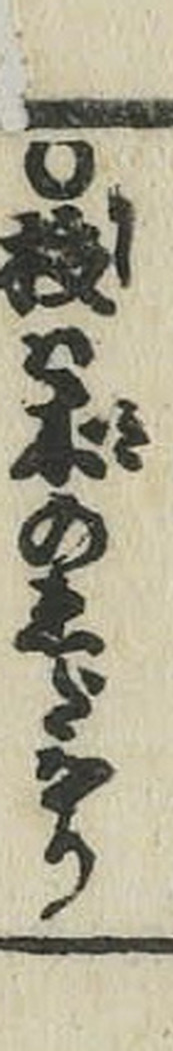○枝は木のゑだなり

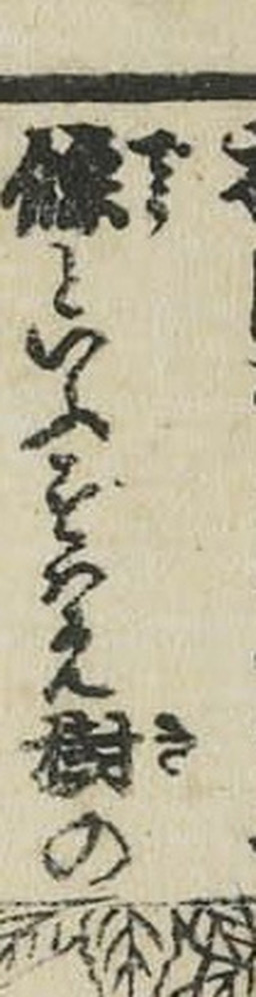條といふすはえ樹の
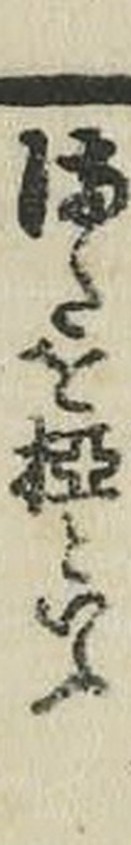またを椏といふ
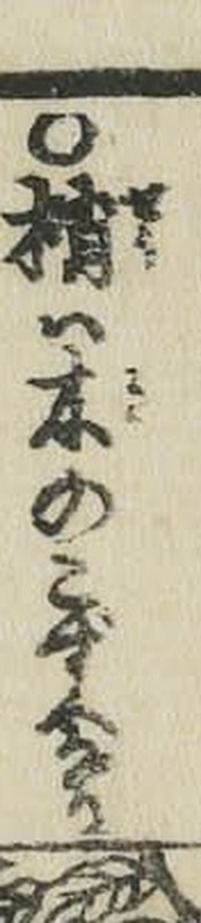○梢は木のこずへなり
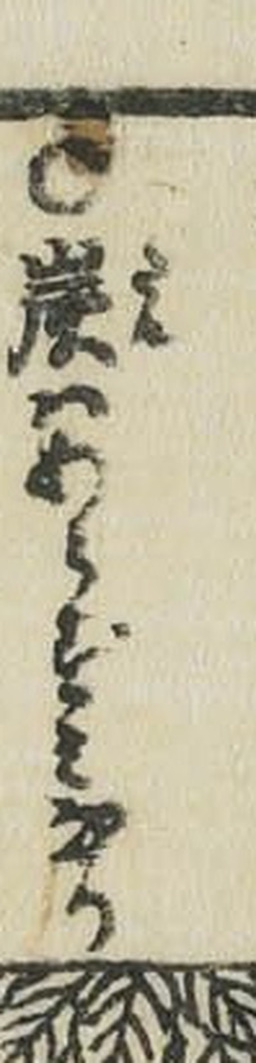○炭はあらずみなり
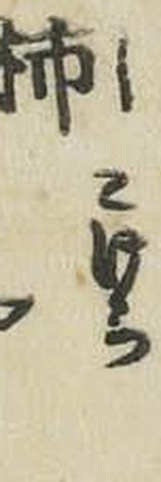杮こけら
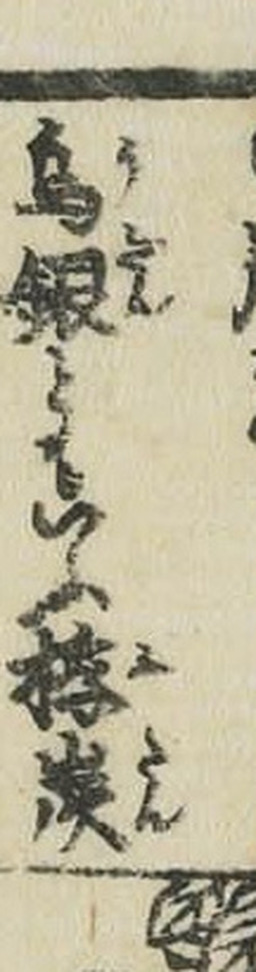烏銀ともいふ桴炭
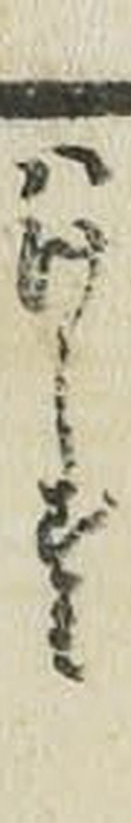はけしずみ
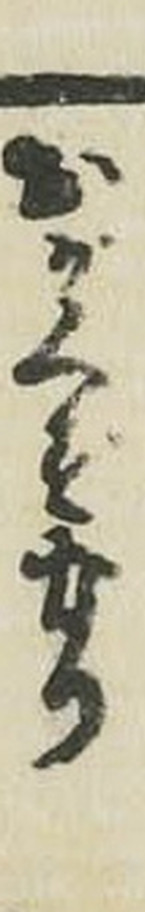おがくずなり
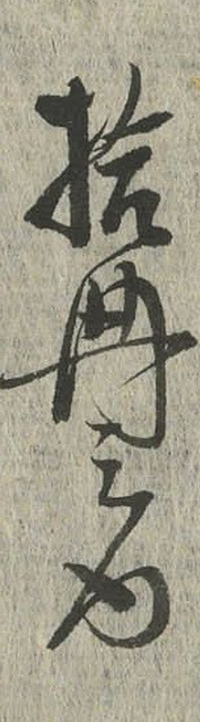拾冊之内
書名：増補頭書訓蒙図彙大成 10巻 8:巻之17-19
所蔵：東京学芸大学教育コンテンツアーカイブ
